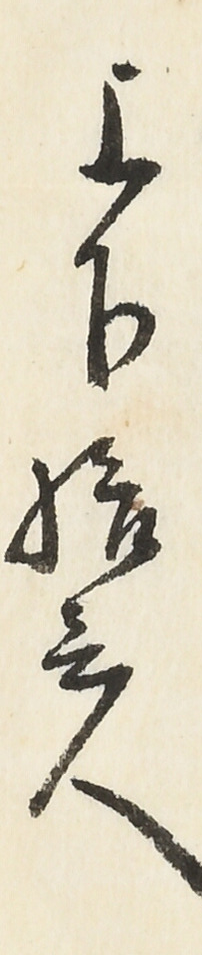上下拾壱人
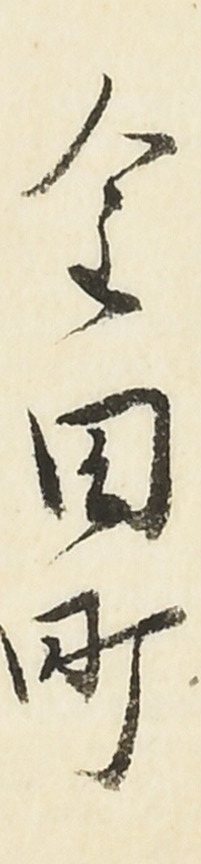金田町
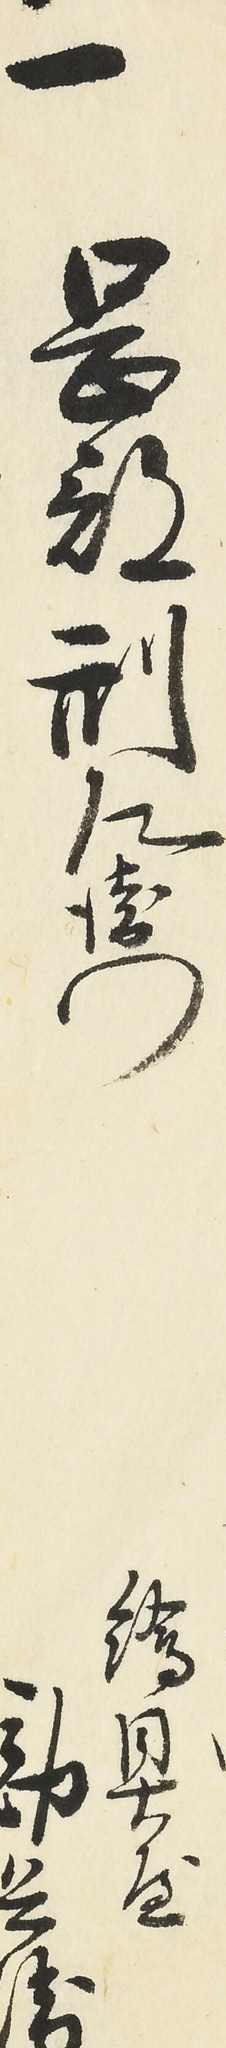・一岡部刑左衛門絵具屋
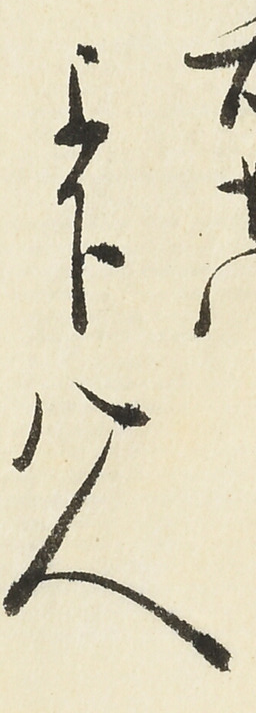上下八人
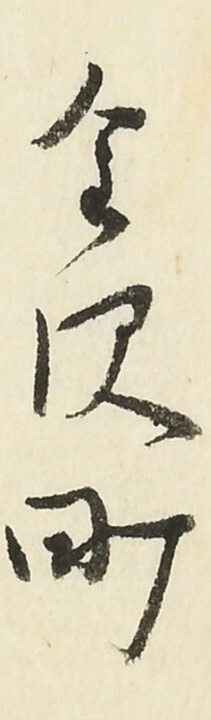金沢町
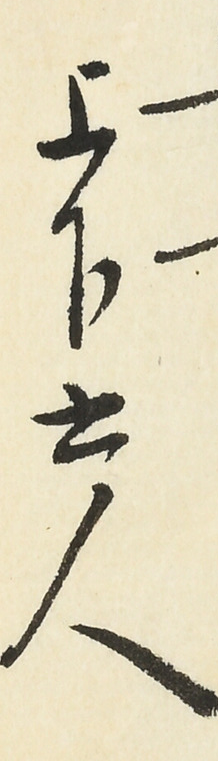上下六人

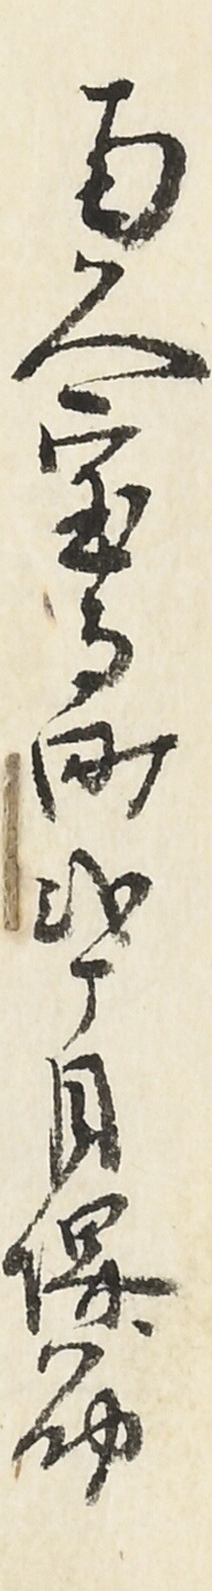南久宝寺町弐丁目堺筋
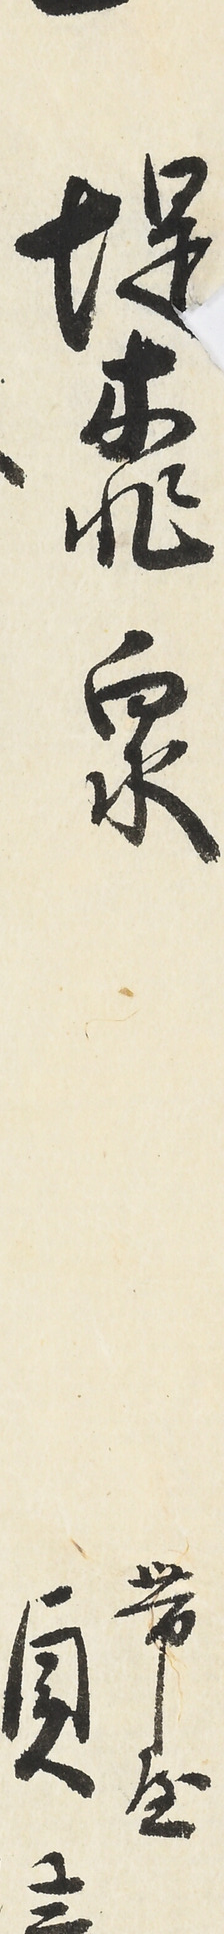・一堤木非泉帯屋
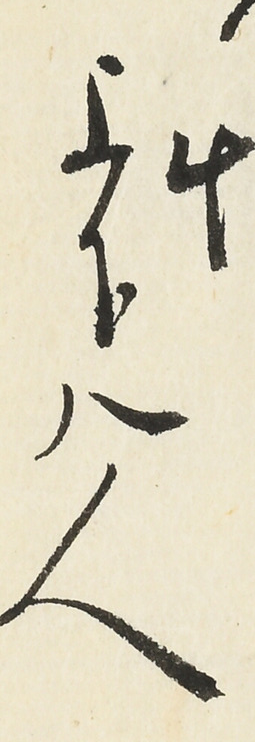上下八人
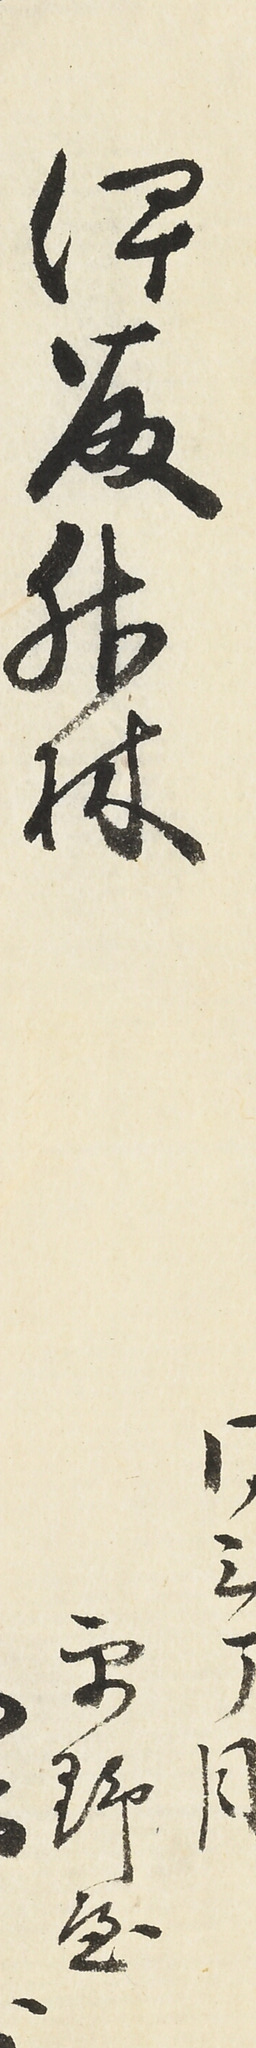・一伊藤升林平野屋
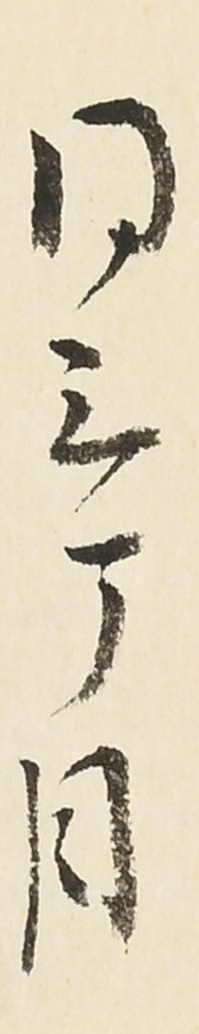同三丁目
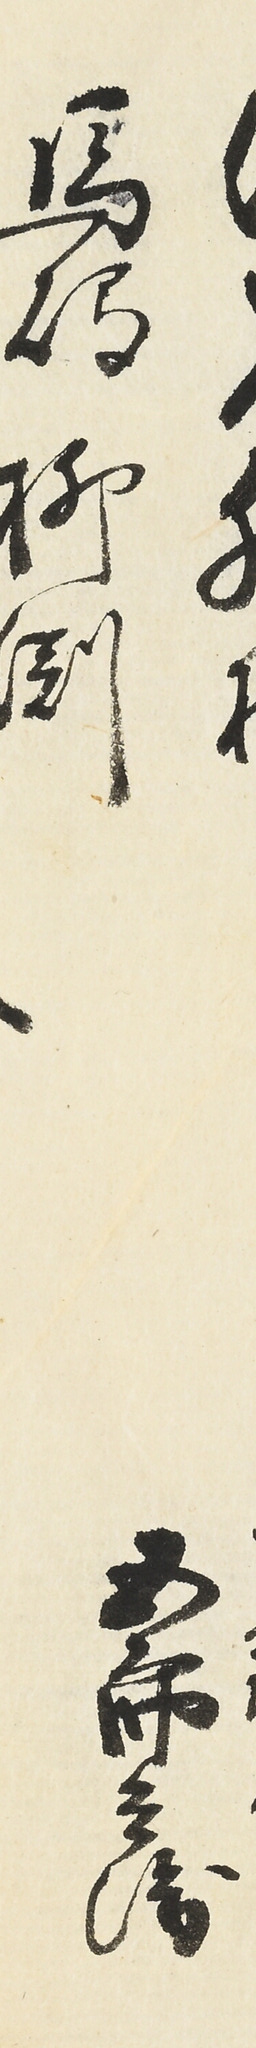馬嶋柳渕五郎兵衛
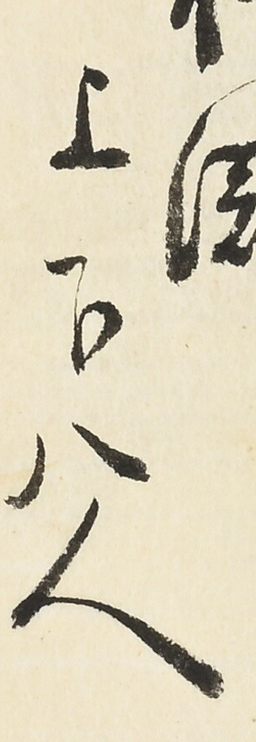上下八人
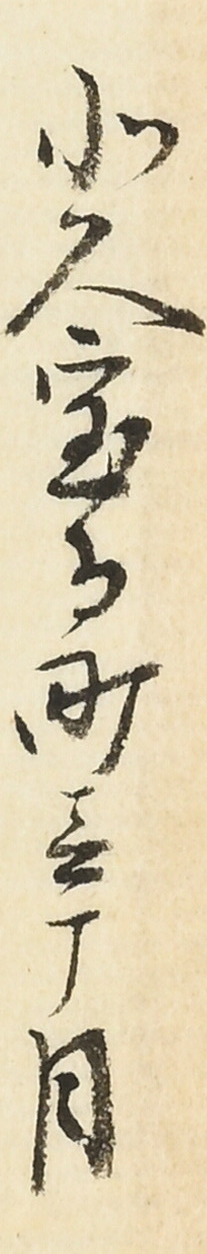北久宝寺町壱丁目
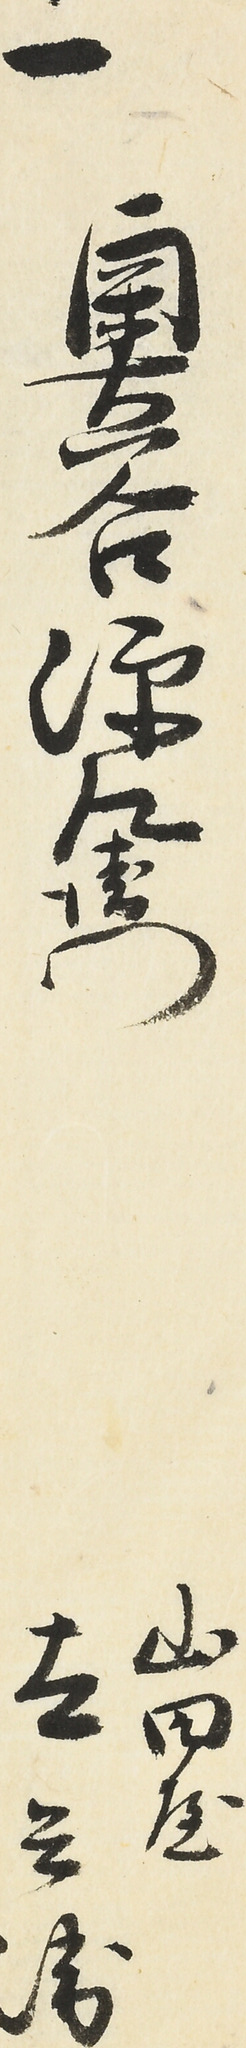・一奥谷源左衛門山田屋
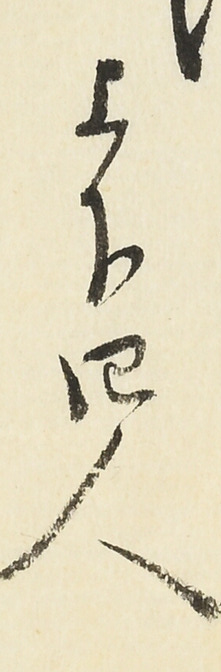上下四人
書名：内藤大和守下宿割
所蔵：伊那市立高遠町図書館・合同会社AMANE
